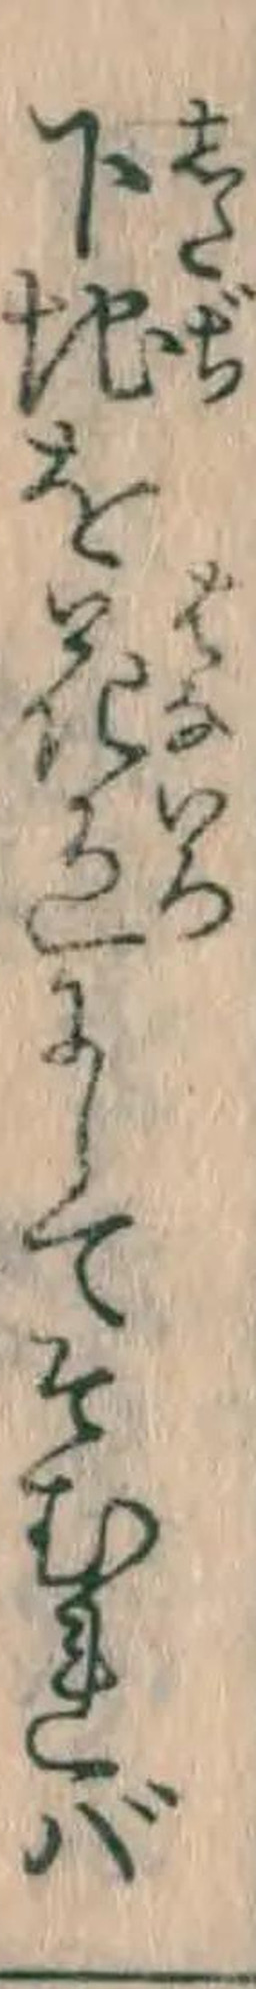下地を花色にしてそむれば
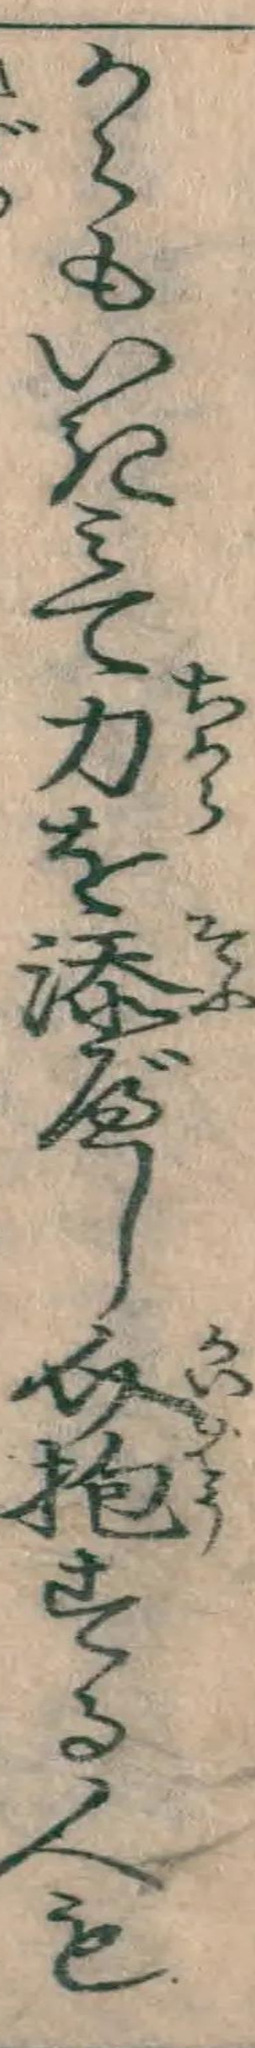からもいきみて力を添べし介抱する人も
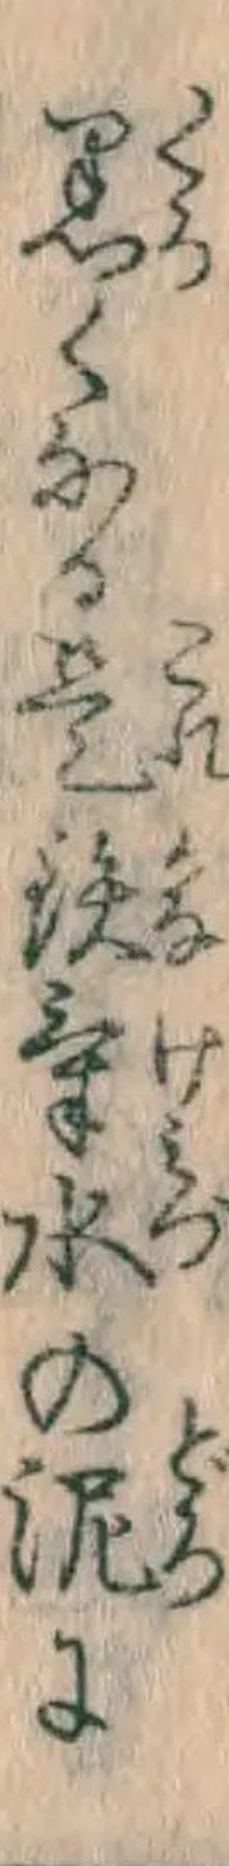黒くなる是鉄気水の泥に
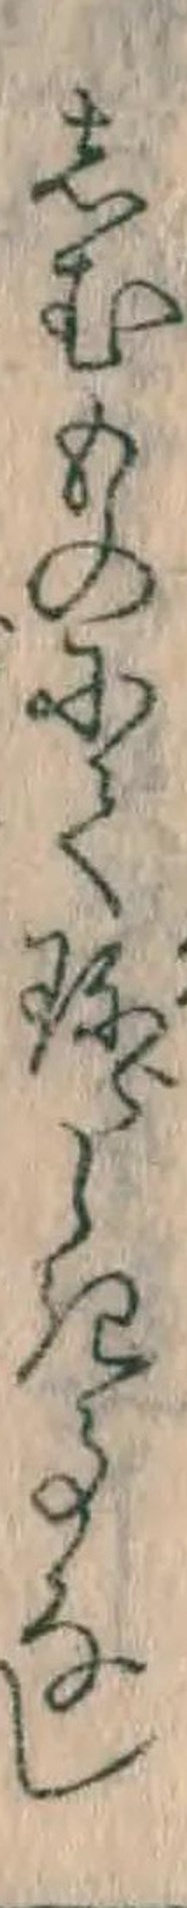しむものにて珍らしき事なし
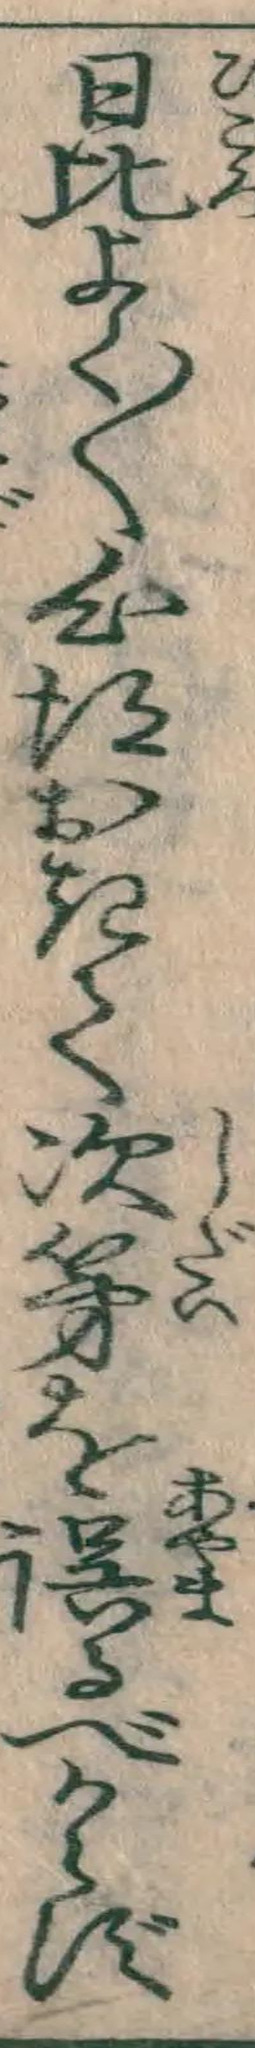日比よく〳〵心得おきて次第を誤るべからず
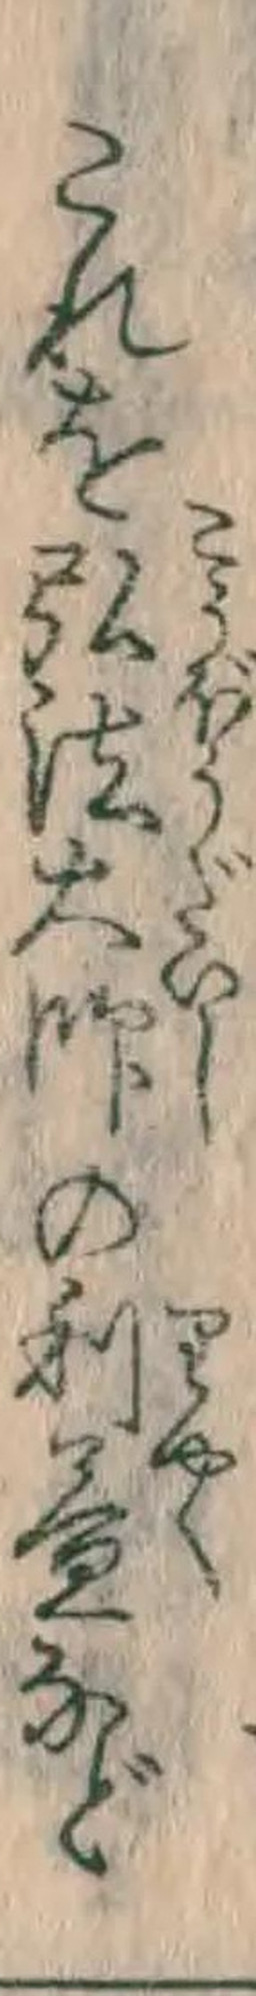これを弘法大師の利益など
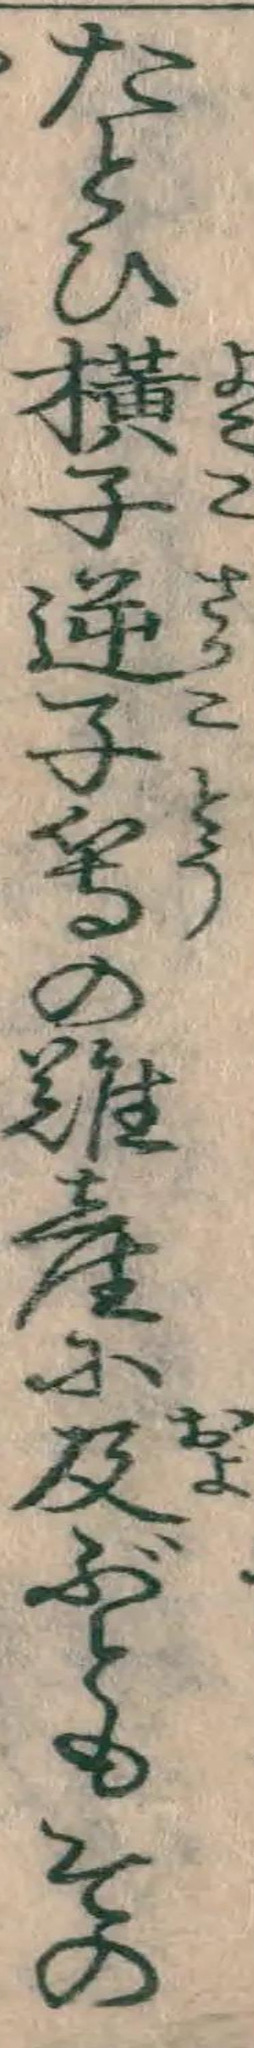たとひ横子逆子等の難産に及ぶともその
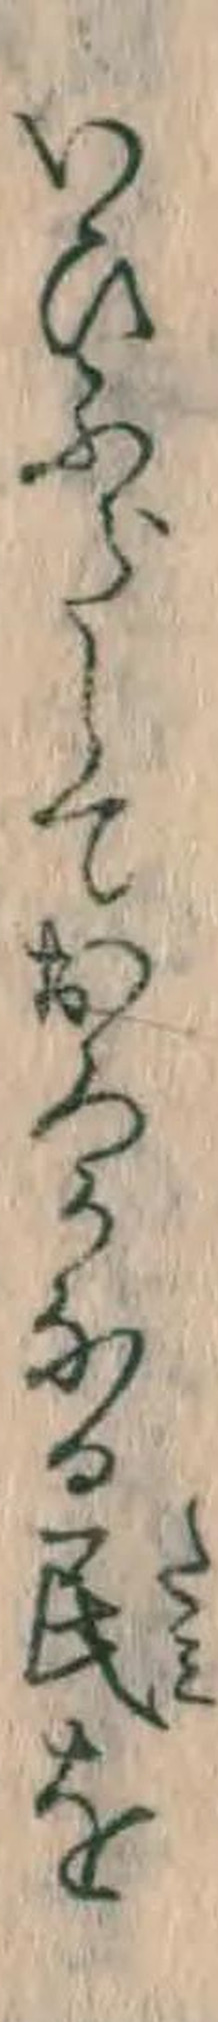いひふらしておろかなる民を
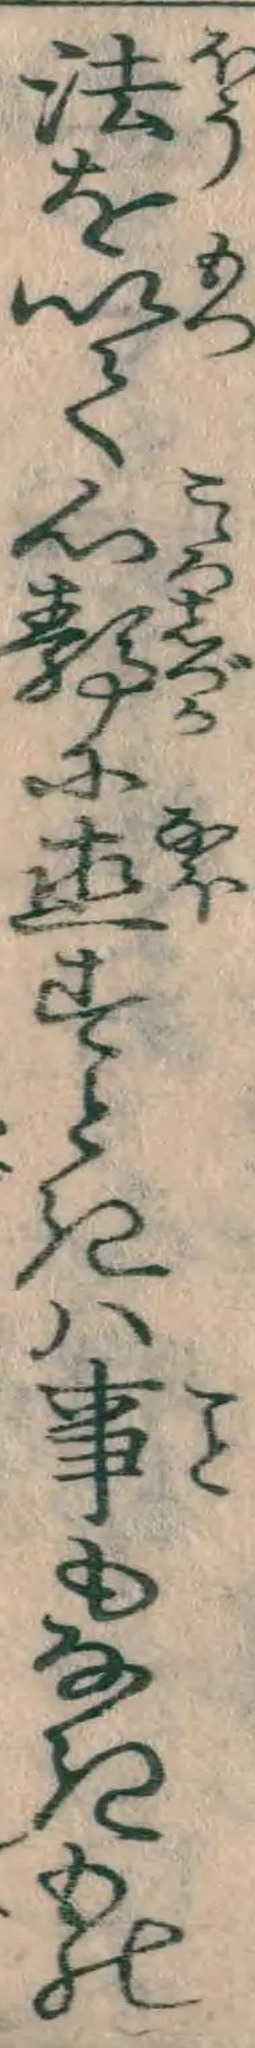法を以て心静に直すときは事もなきもの
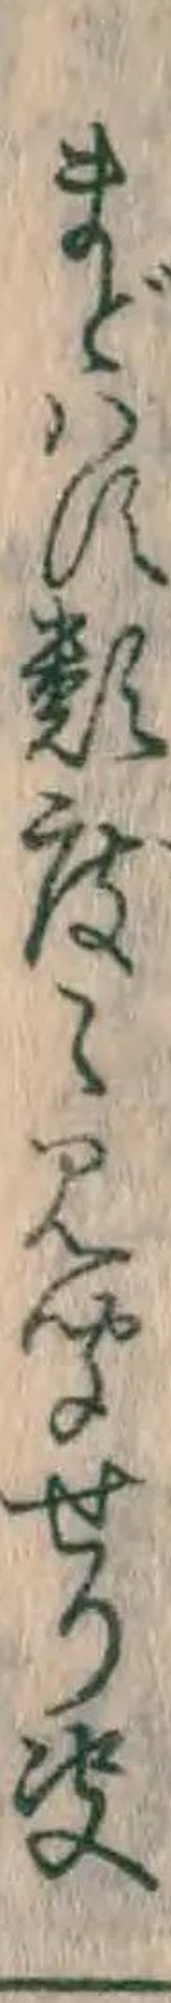まどはす類度々見聞せり決
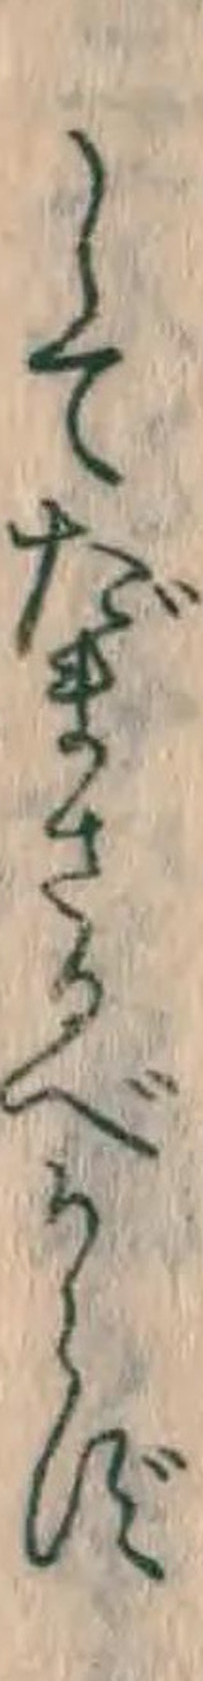してだまさるべからず
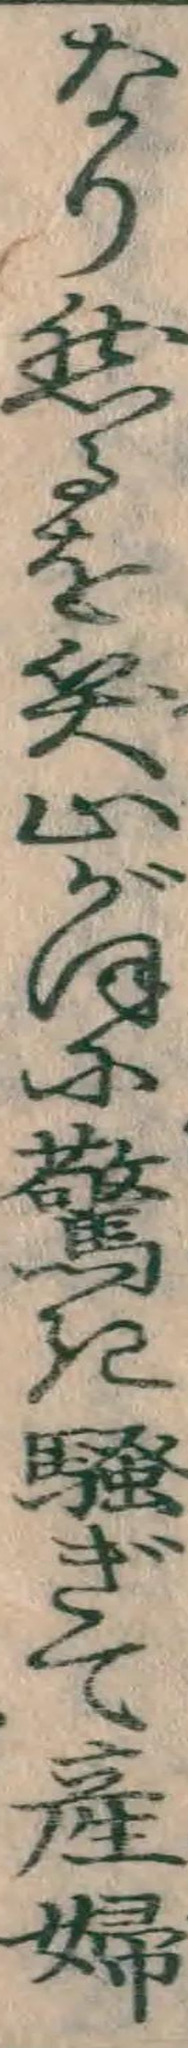なり然るを笑止がほに驚き騒ぎて産婦
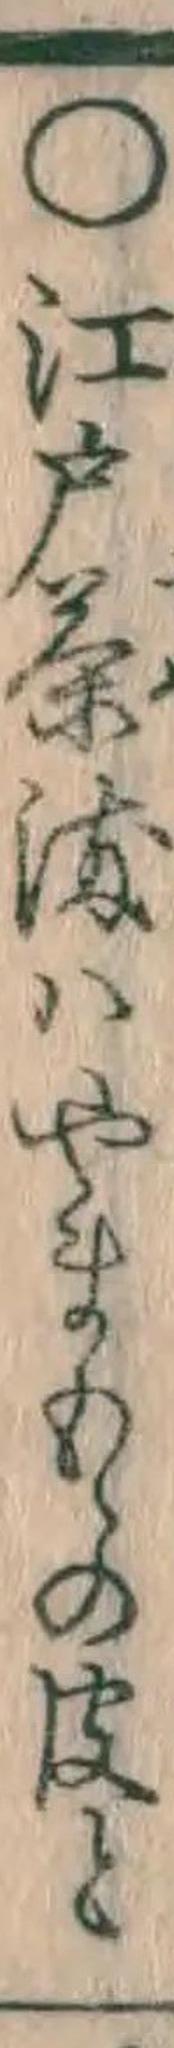○江戸茶染はやまもゝの皮と
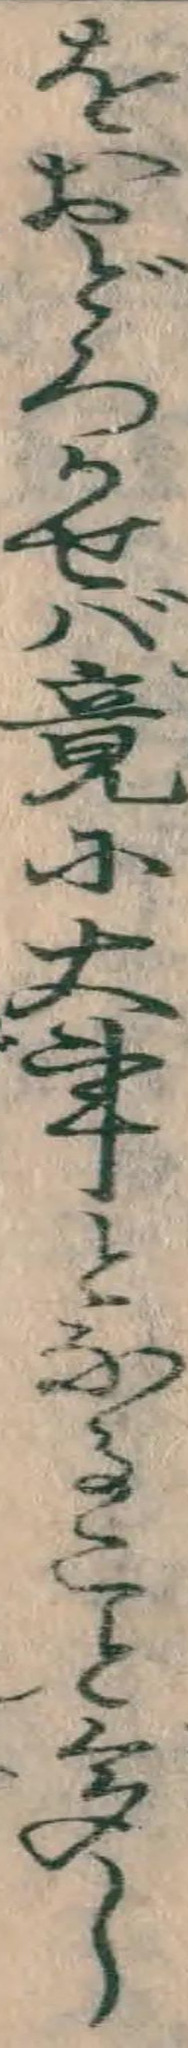をおどろかせば竟に大事となること多し
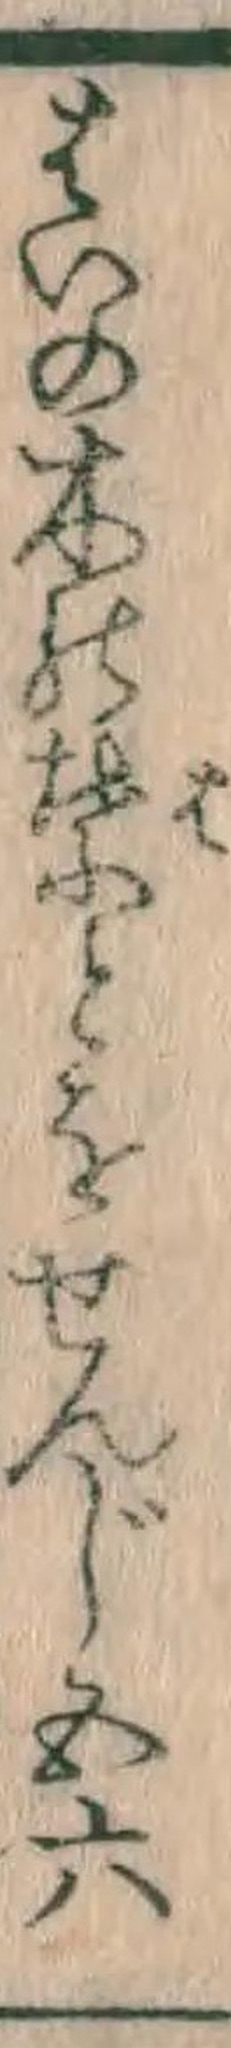はいの木の葉とをせんじ五六
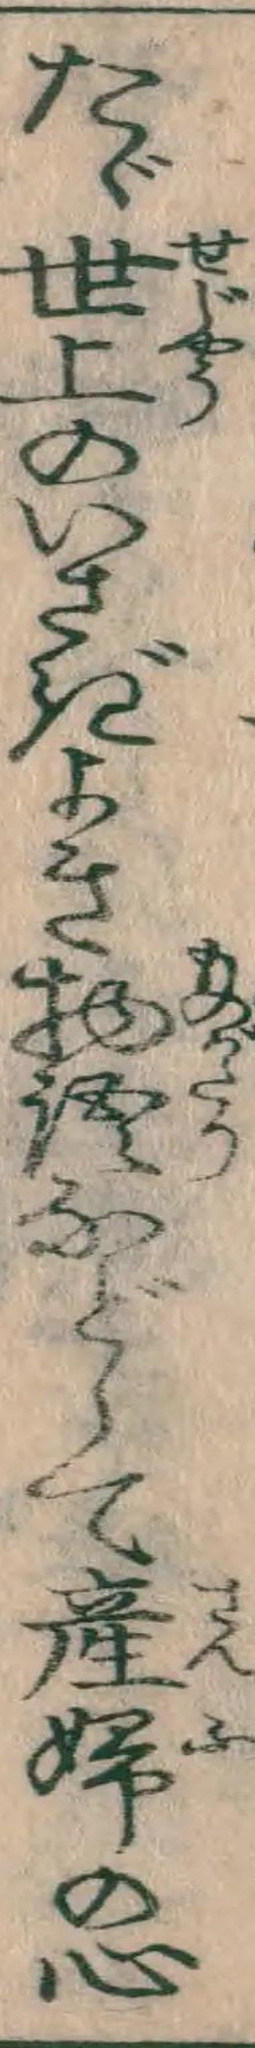たゞ世上のいさぎよき物語などして産婦の心
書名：広益秘事大全 3巻. [3]
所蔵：国立国会図書館 National Diet Library, JAPAN
